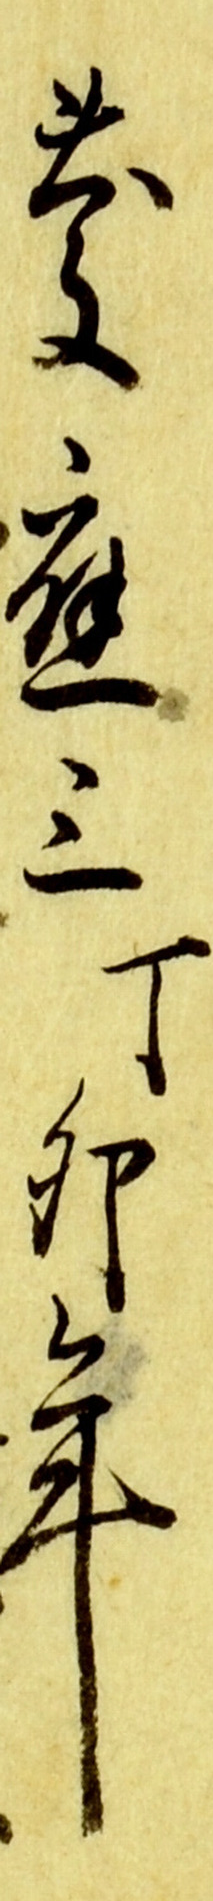慶応三丁卯年
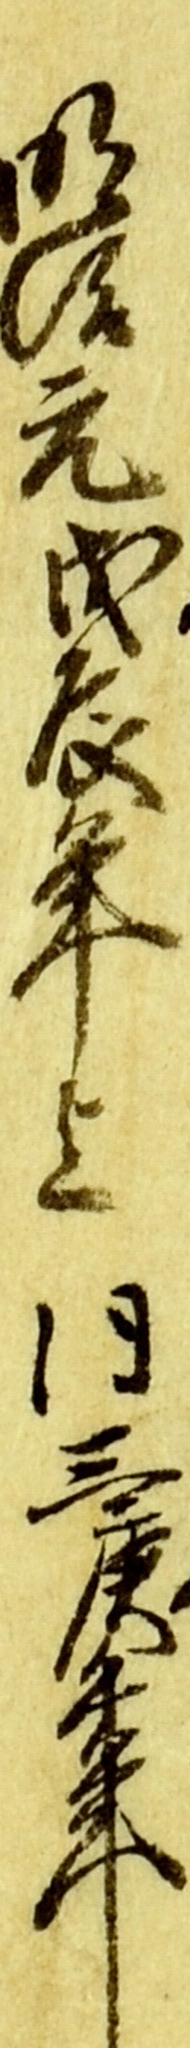明治元戊辰年迄同三庚午年
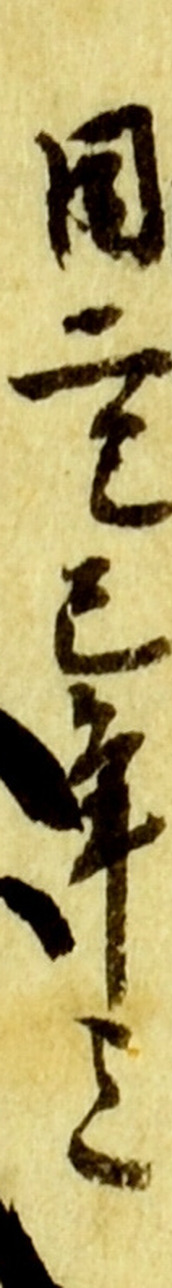同二己巳年迄
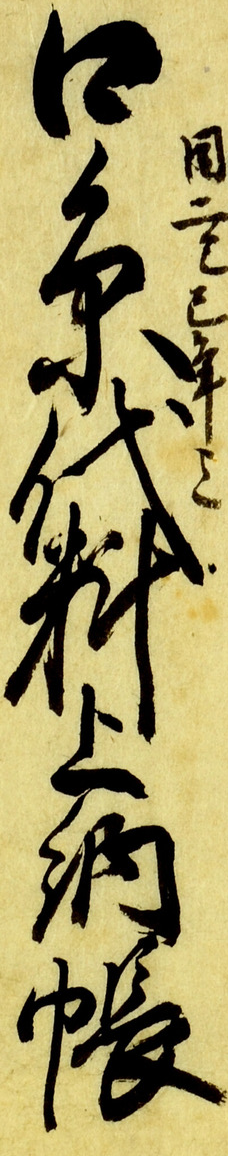口糸代料上納帳
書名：口糸代料上納帳
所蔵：伊那市立高遠町図書館・合同会社AMANE
